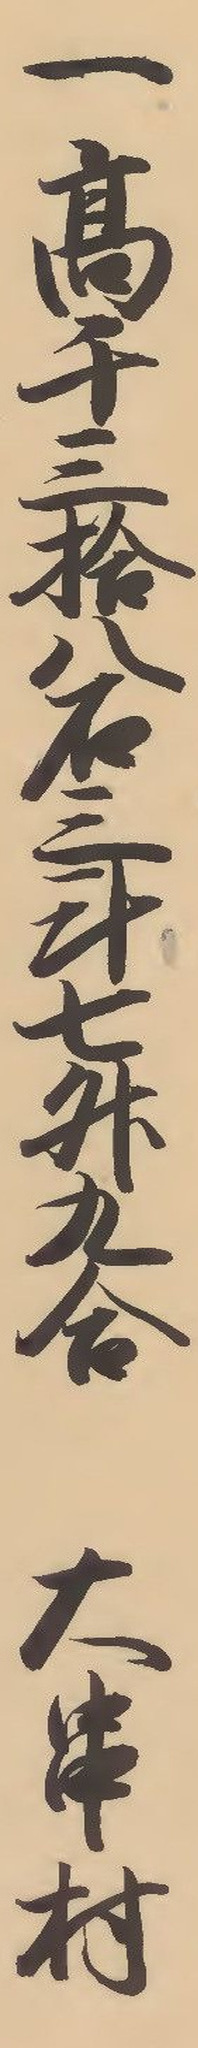一高千三拾八石三斗七升九合大串村
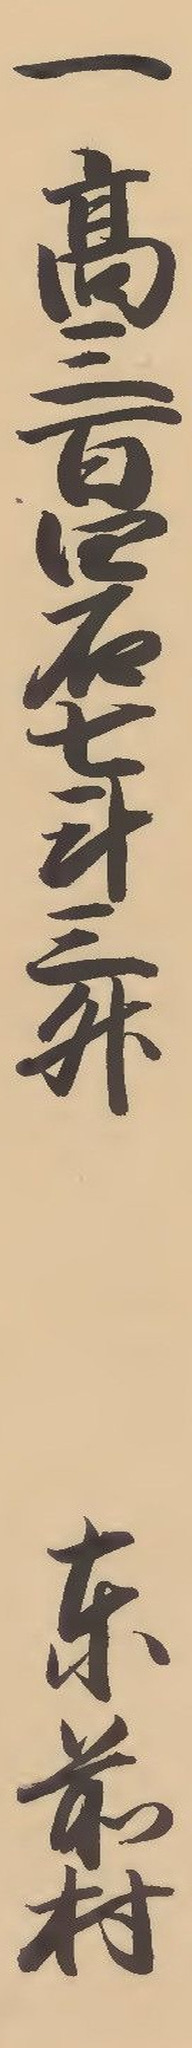一高三百四石七斗三升東前村

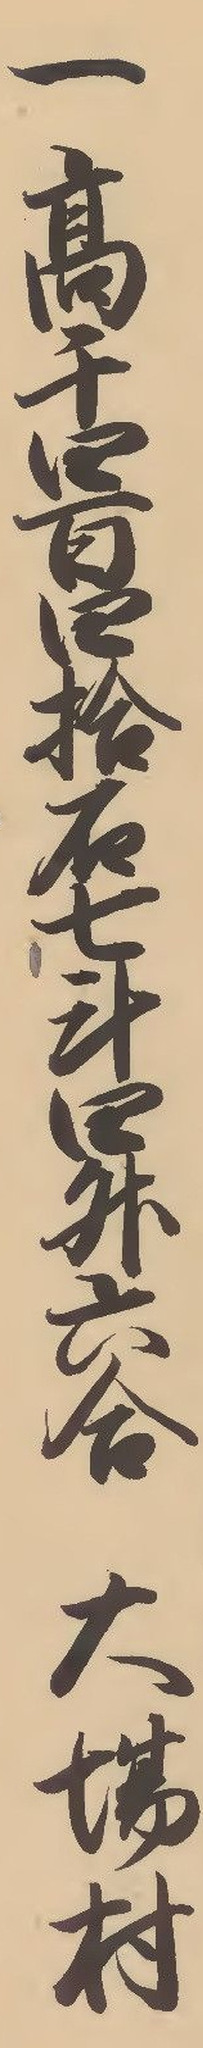一高千四百四拾石七斗四升六合大場村
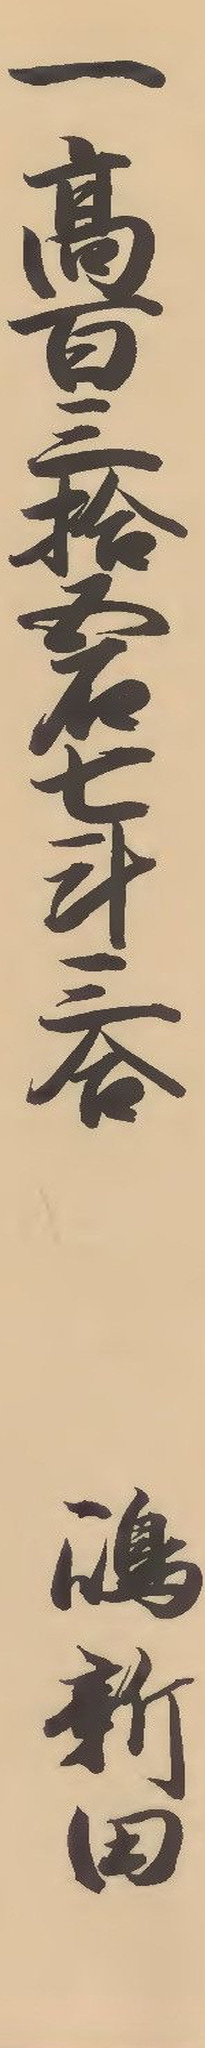一高百三拾五石七斗三合島新田
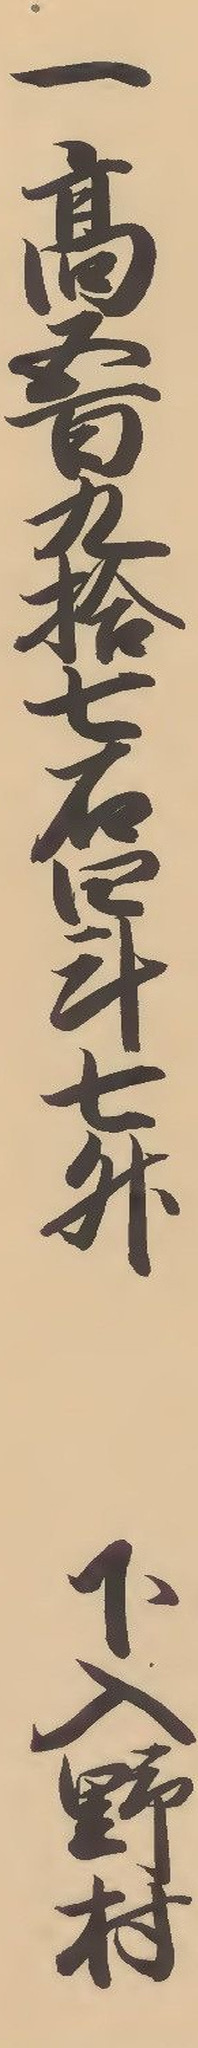一高五百九拾七石四斗七升下入野村
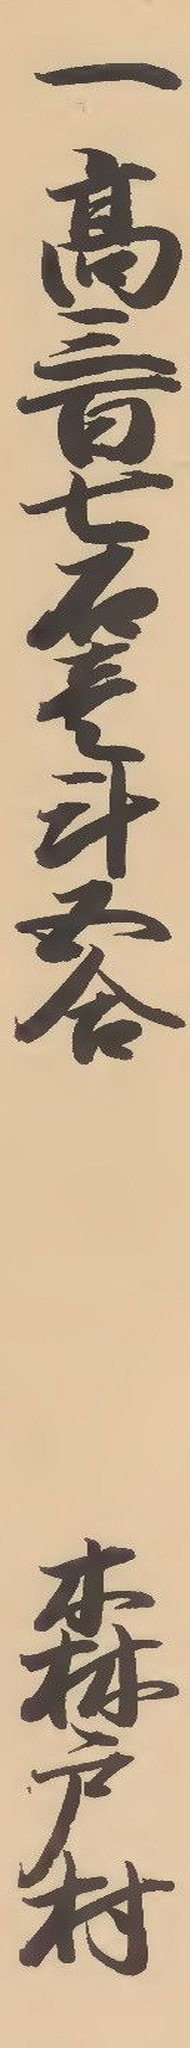一高三百七石壱斗五合森戸村
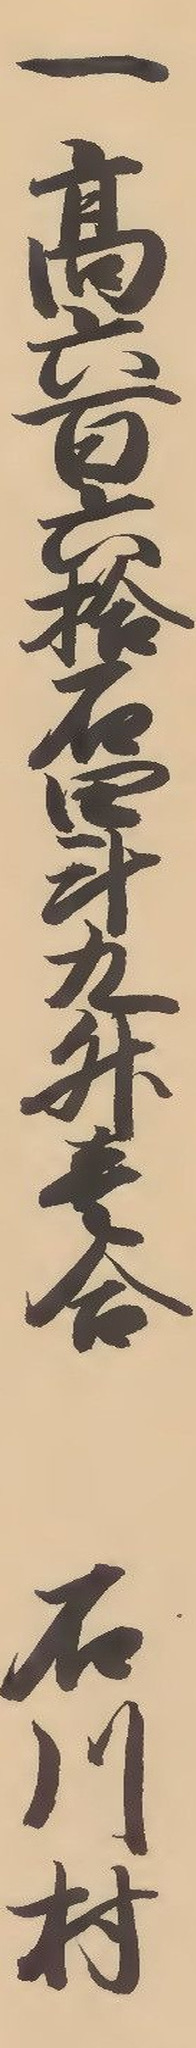一高六百六拾石四斗九升壱合石川村
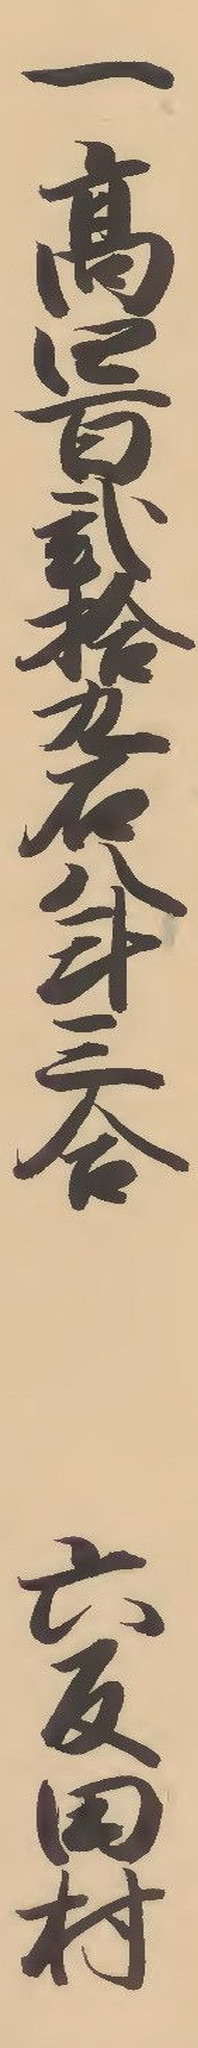一高四百弐拾九石八斗三合六反田村
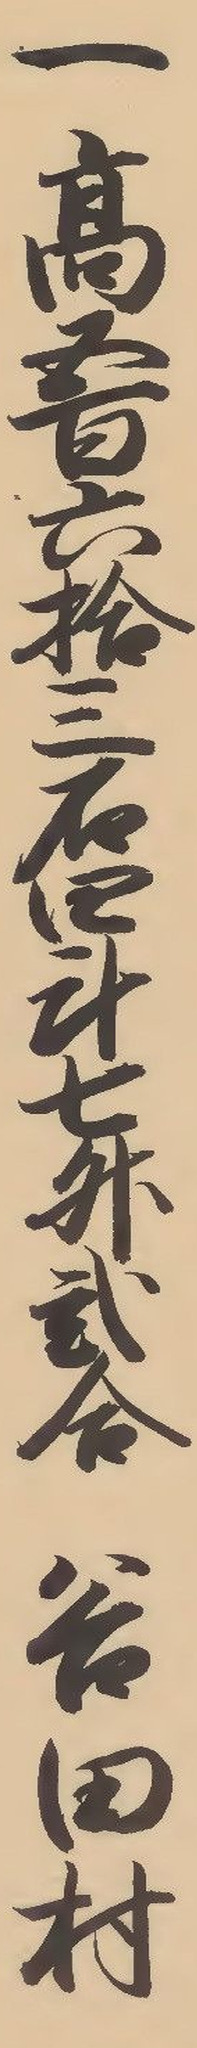一高五百六拾三石四斗七升弐合谷田村

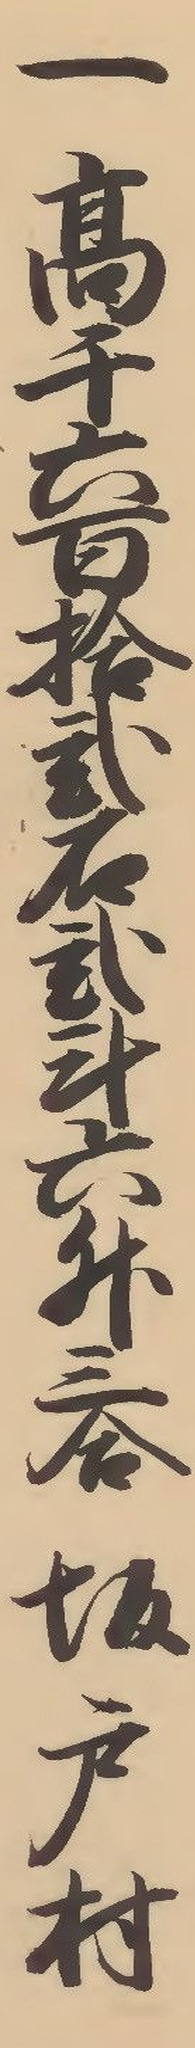一高千六百拾弐石弐斗六升三合坂戸村
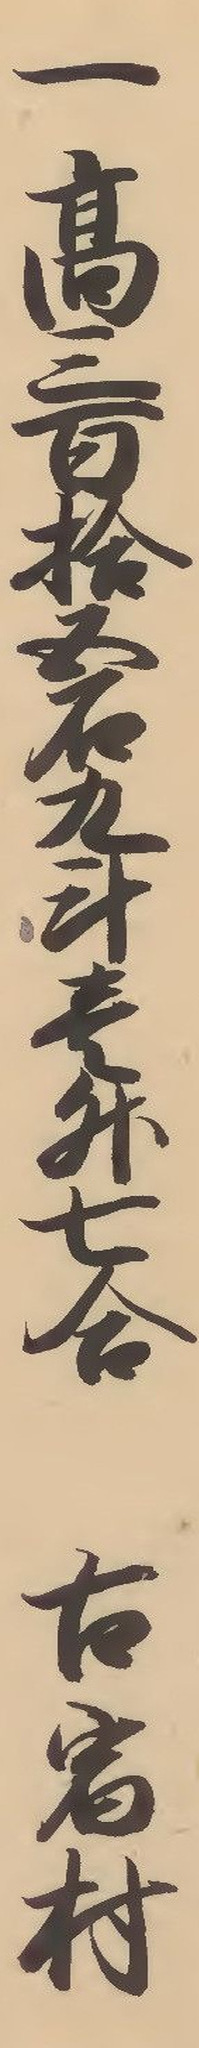一高三百拾五石九斗壱升七合古宿村
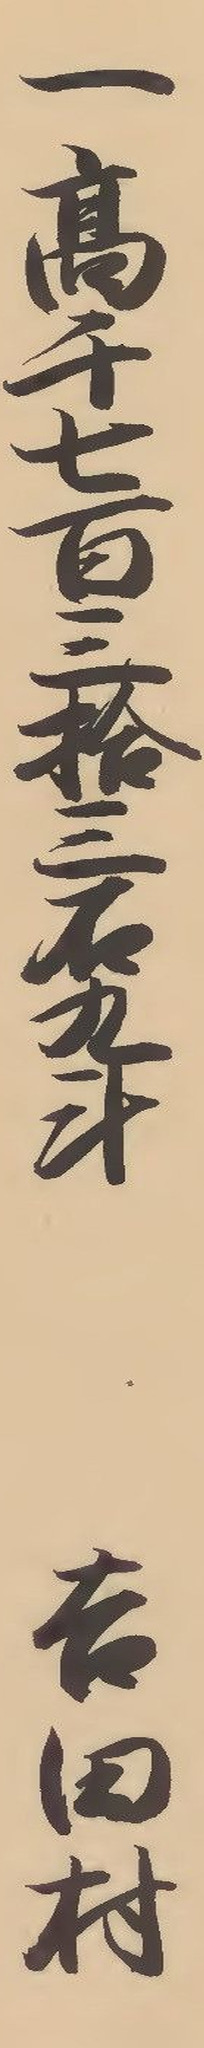一高千七百三拾三石九斗吉田村
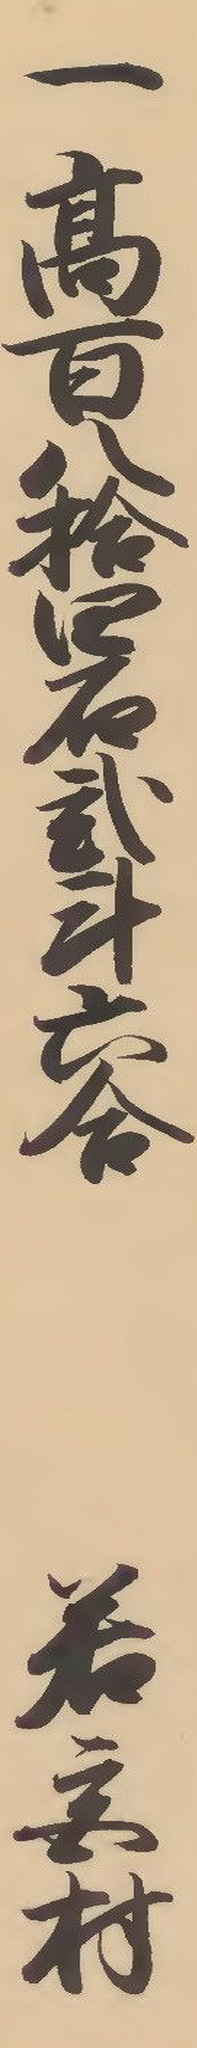一高百八拾四石弐斗六合若宮村
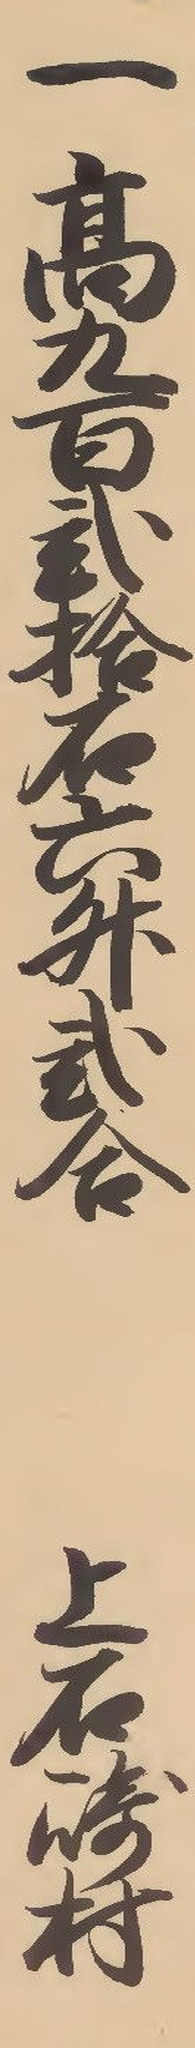一高九百弐拾石六升弐合上石崎村
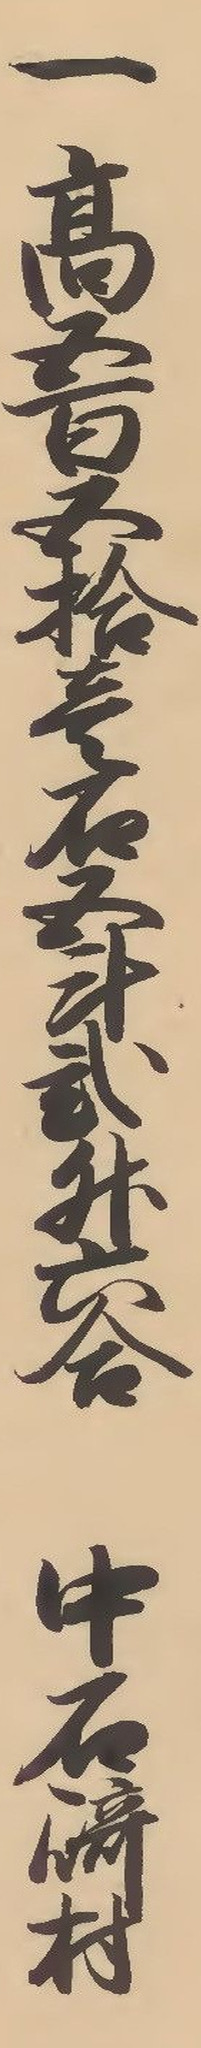一高五百五拾壱石五斗弐升六合中石崎村
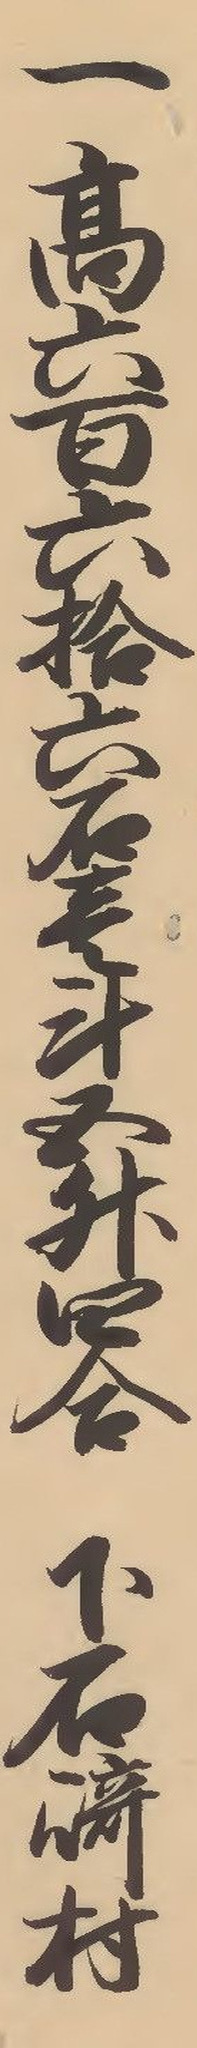一高六百六拾六石壱斗五升四合下石崎村
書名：常陸国郷帳
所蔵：国立公文書館 National Archives of Japan
